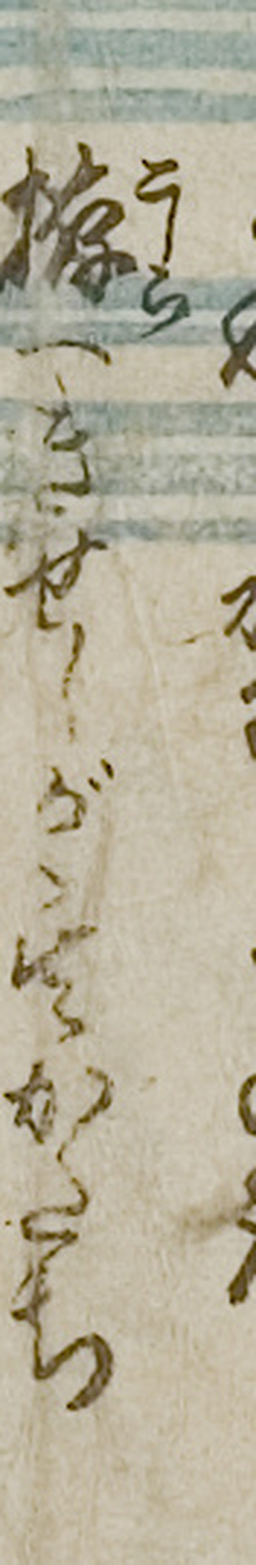拵へきせしが其かたち
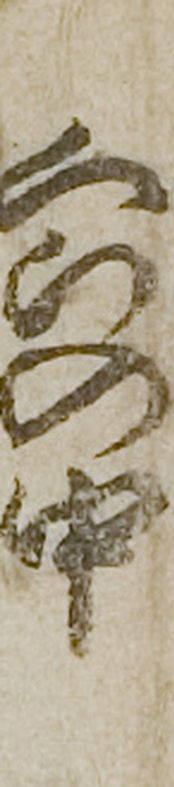くいの中
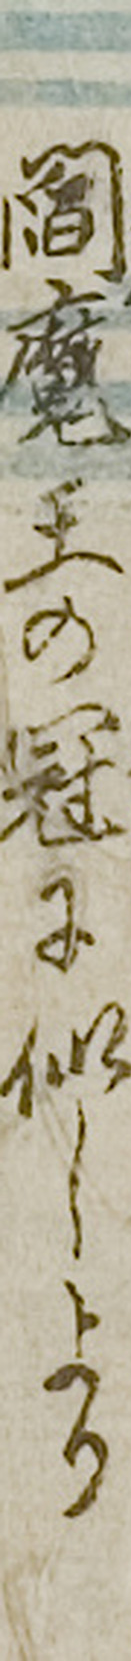閻魔王の冠に似しより
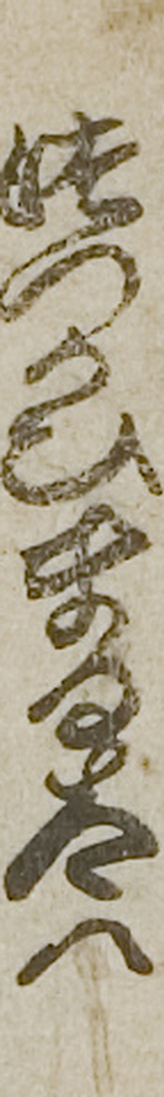つつかひまる太は
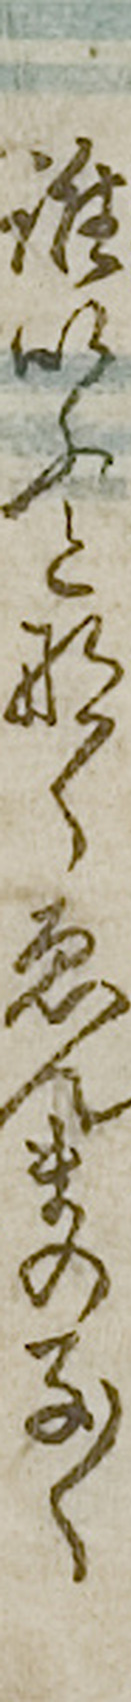誰いふとなくゑんまの子〳〵
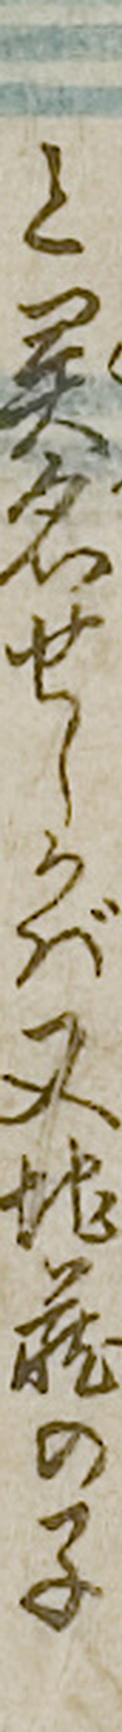と異名せしかば又地蔵の子
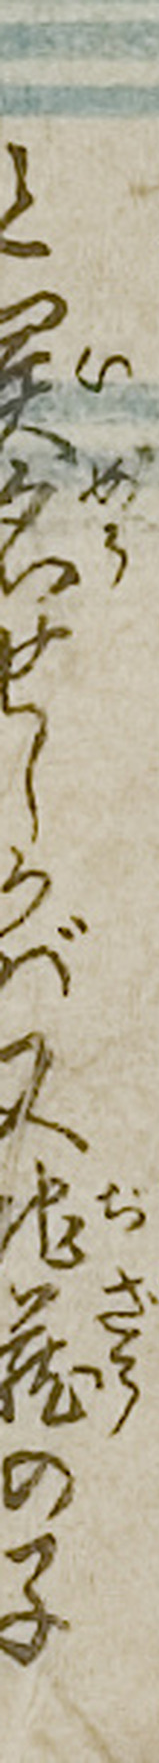と異名せしかば又地蔵の子
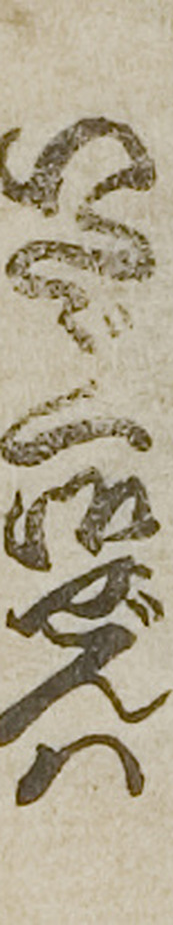いたゞく御ぜんは
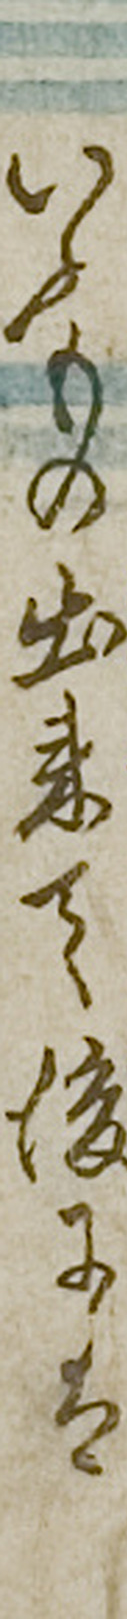いふもの出来て後には
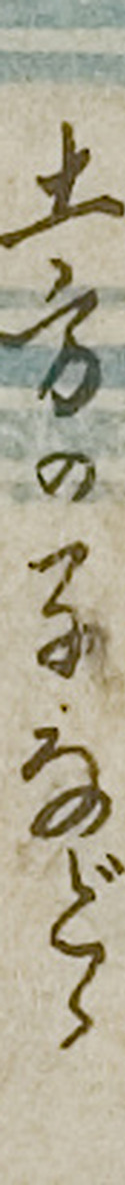土方の子などゝ
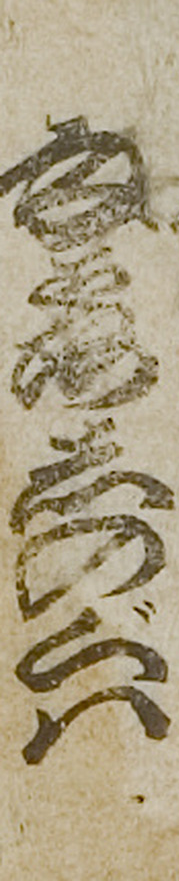雨露しのぐは
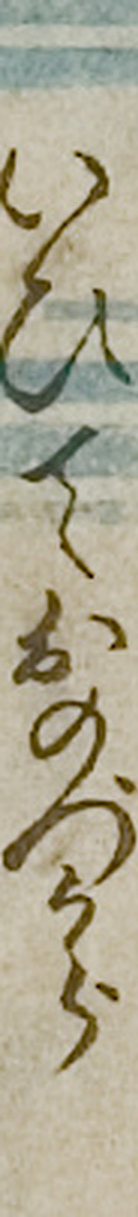いひておのづから
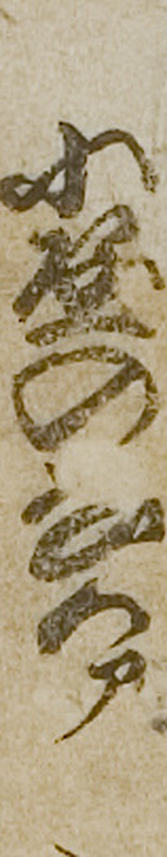小屋のなかあ
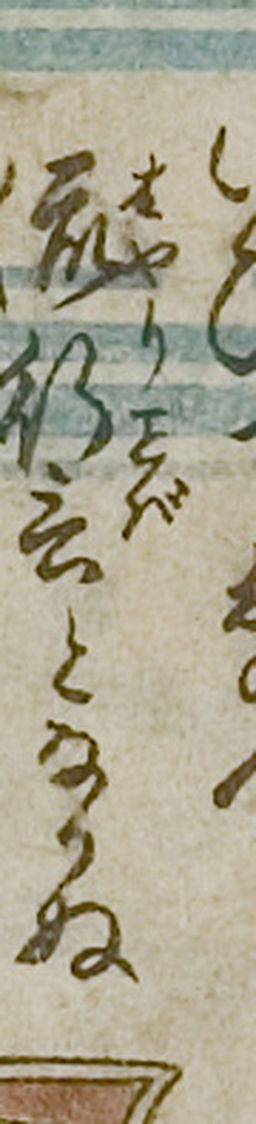流行言となりぬ
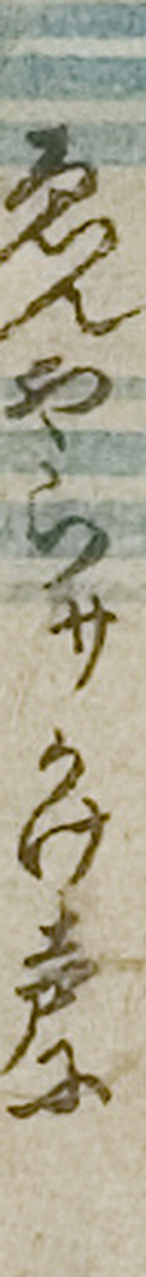ゑんやらさかけ声に
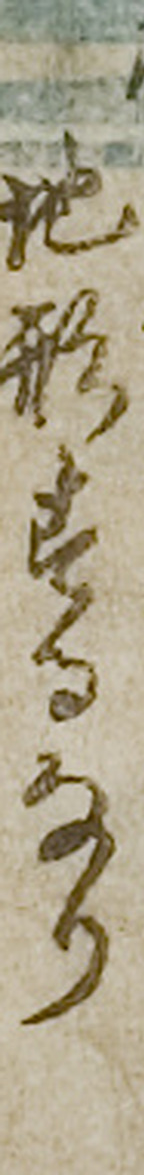地形するなり
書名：ゑんまの子のわけ
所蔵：東京大学総合図書館 General Library in the University of Tokyo, JAPAN
